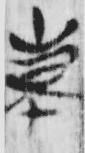東
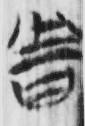周
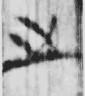之
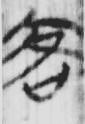客
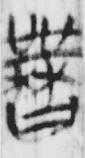○（許）
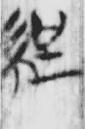○（盈）
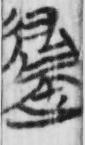歸
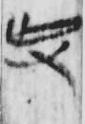乍（胙）
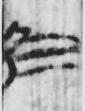於
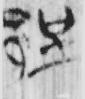郢
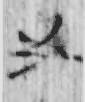之
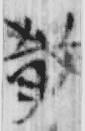歲（歲）
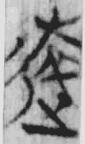遠
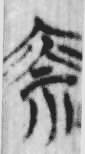○（夕）
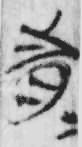之月
